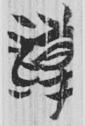○（旱）
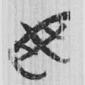母（毋）
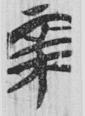帝（謫）
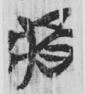𨟻（將）
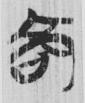命
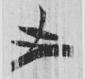之
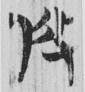攸（修）
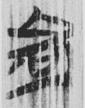者（諸）
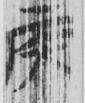侯
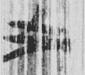之
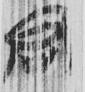君
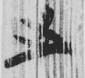之
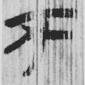不
